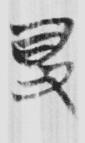{貝寸}
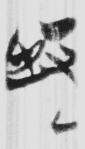臤
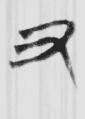又
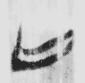㠯（以）
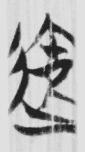御
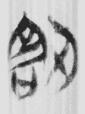割
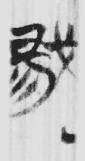{昜戈}
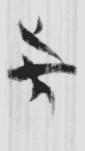先
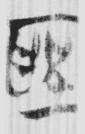聖
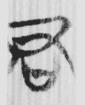君
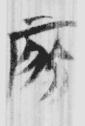所
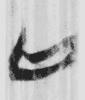㠯（以）
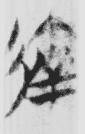{彳𦍒}
